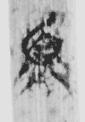寡
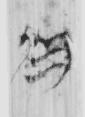於
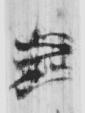者
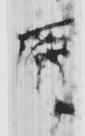侯
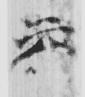亓
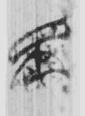民
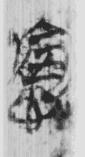{偷心}
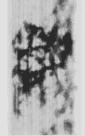敝
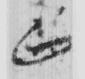㠯（以）
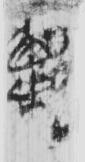{邑角牛}
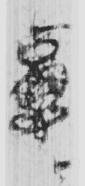{肙心}
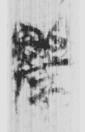{門厇}
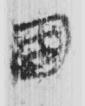固
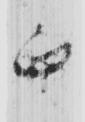㠯（以）
